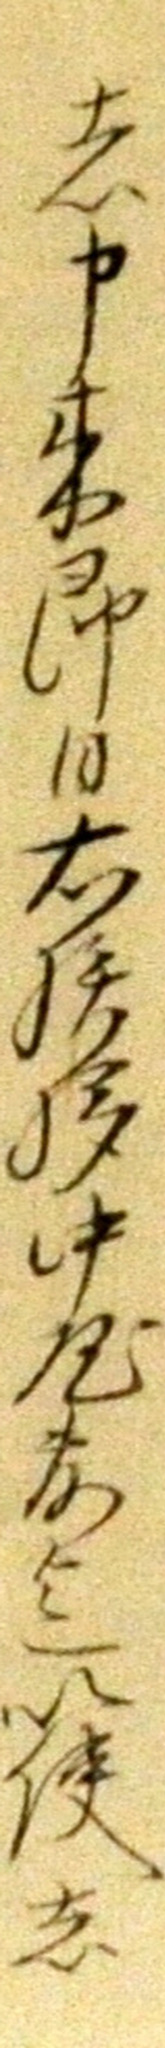者申来即日右挨拶中屋敷迄以使者
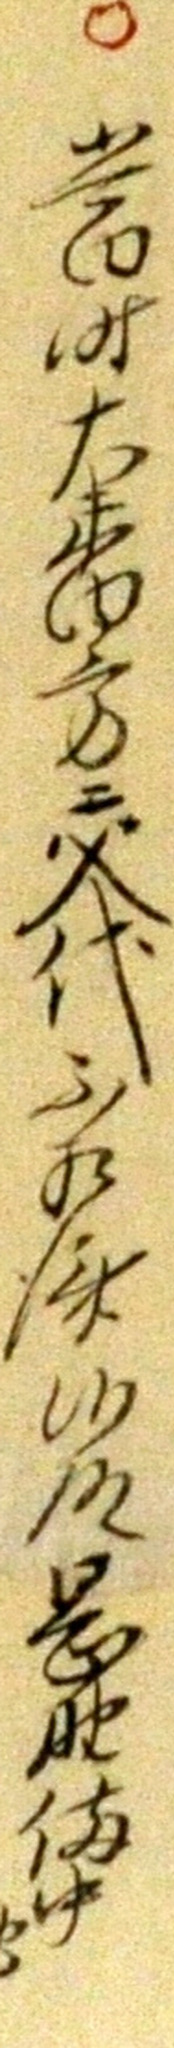当時大番方交代不相済候故岡野備中守
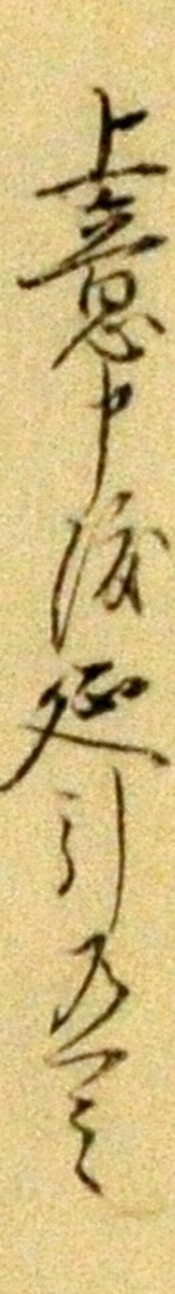上意申渡延引有之
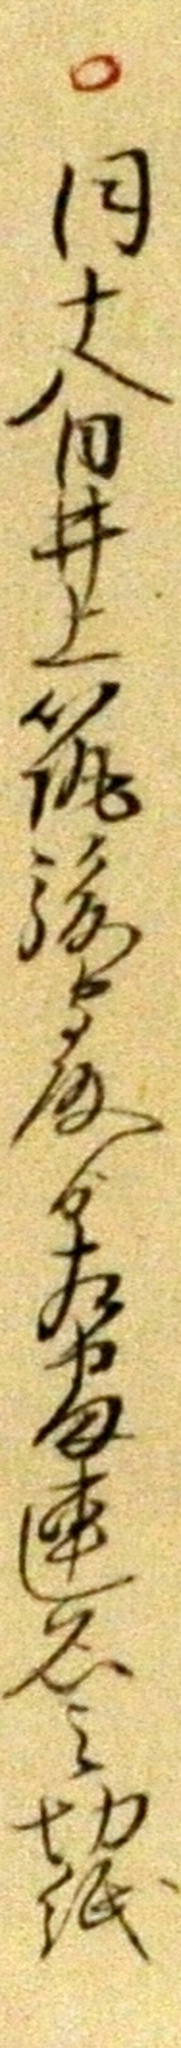同十八日井上筑後守殿ゟ相番連名之切紙
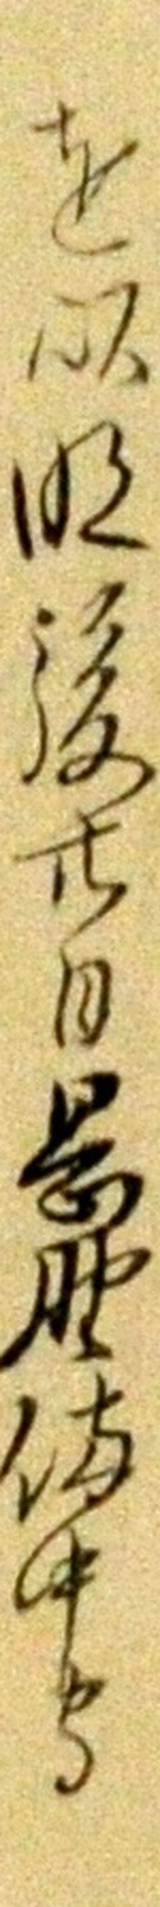を以明後廿日岡野備中守
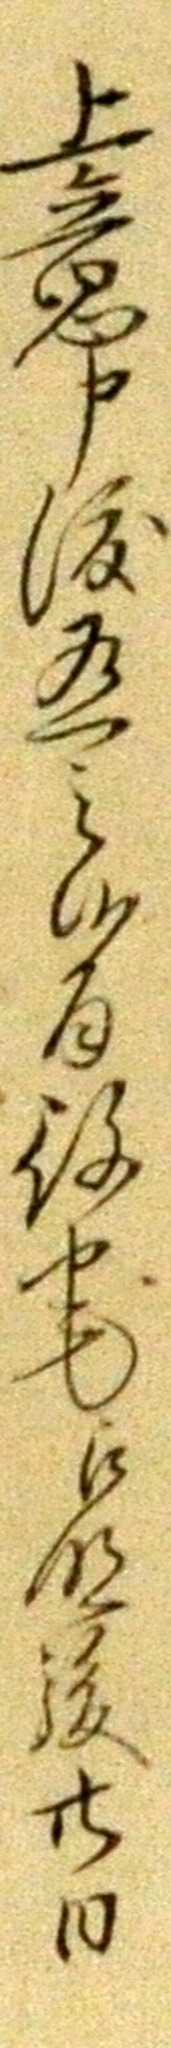上意申渡有之候間役宅え明後廿日
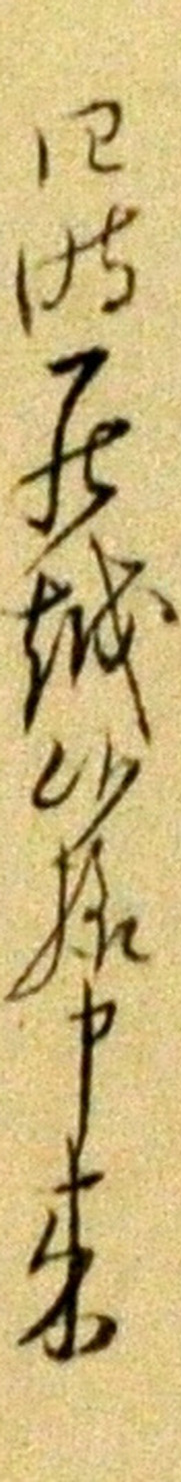四時罷越候様申来
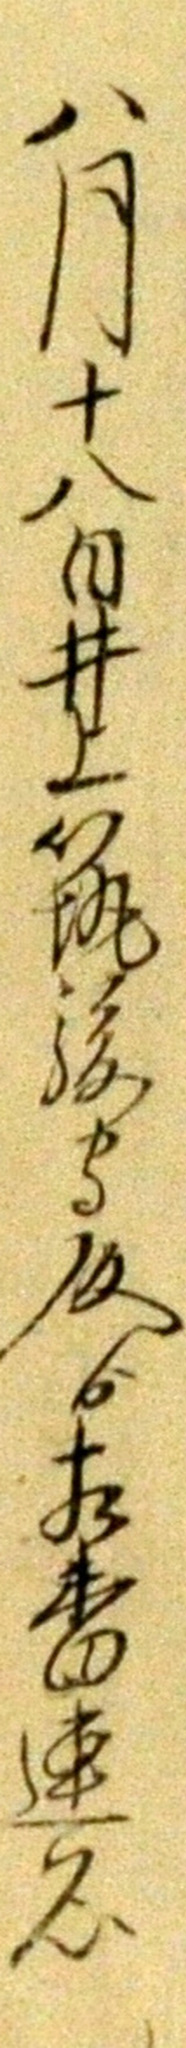八月十八日井上筑後守殿ゟ相番連名
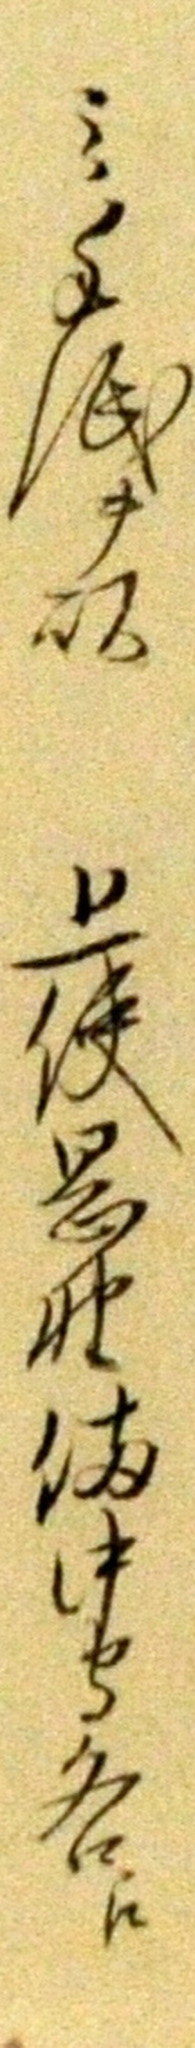之手紙ヲ以上使岡野備中守各え
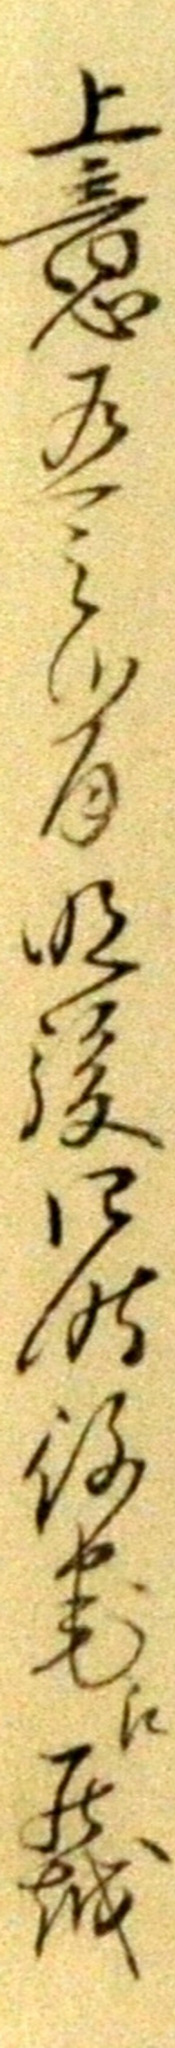上意有之候間明後四時役宅え罷越

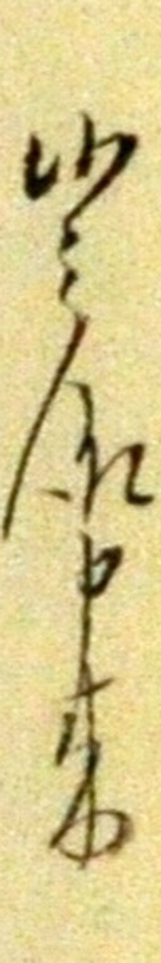候之様申来
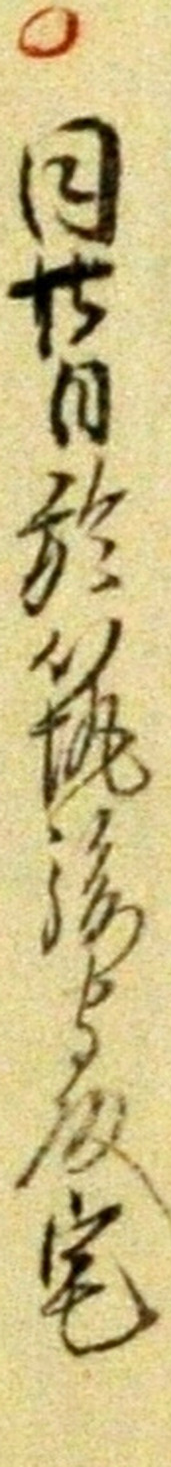同廿日於筑後守殿宅
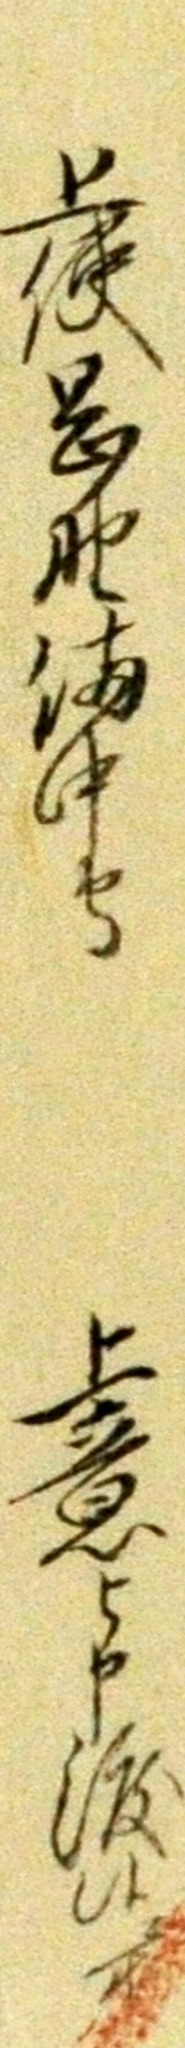上使岡野備中守上意被申渡候ニ付
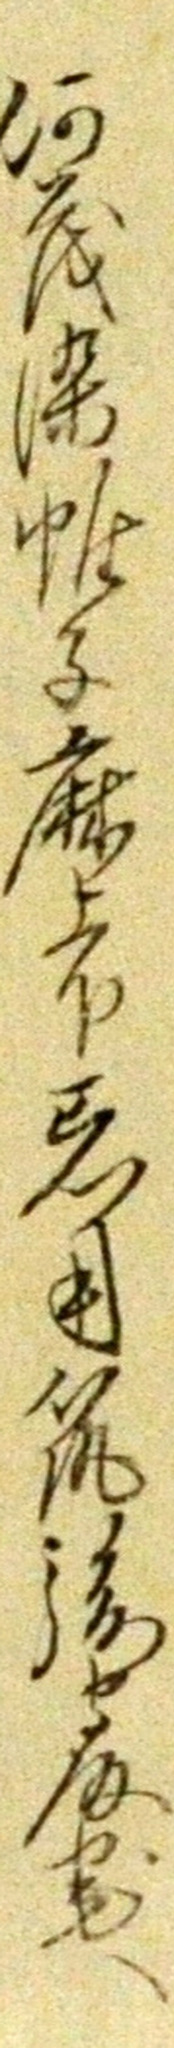何も染帷子麻上下着用筑後守殿宅へ
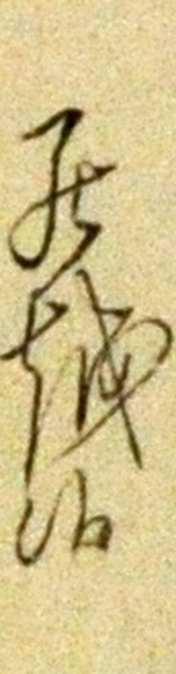罷越候
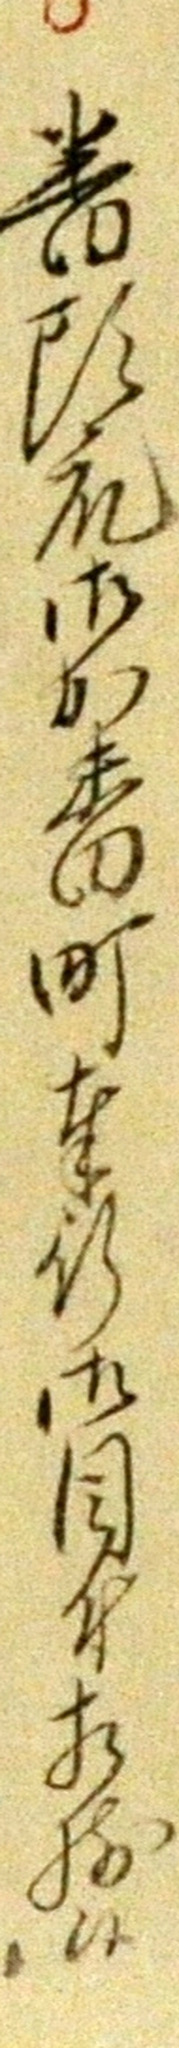番頭衆御加番町奉行御目付相揃候
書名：大阪加番関係諸書留〔一括〕
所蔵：伊那市立高遠町図書館・合同会社AMANE
